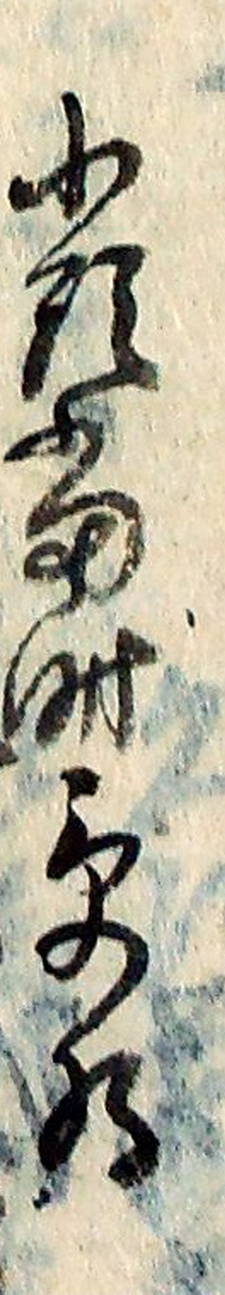小頭当時受持
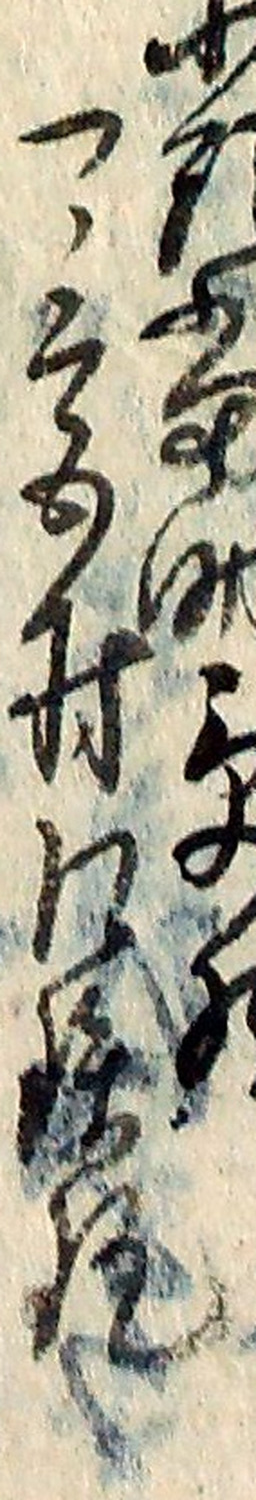一ノ宮村郷鉄砲
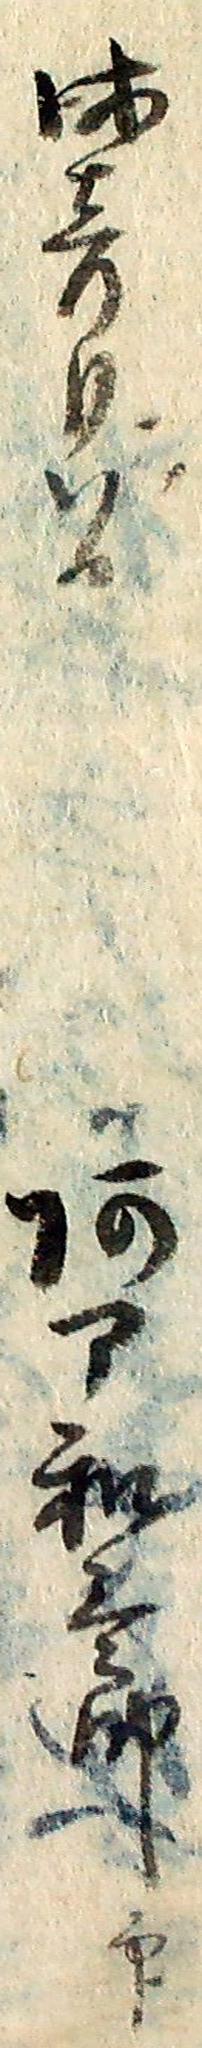戌十二月廿八日阿部和三郎印
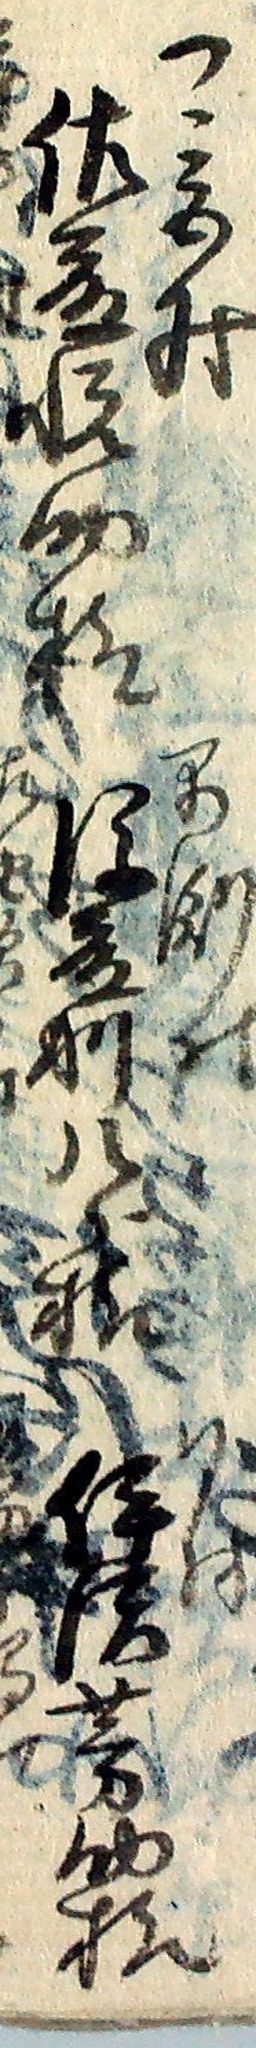佐藤悦助様後藤利八郎様伊沢芳助様
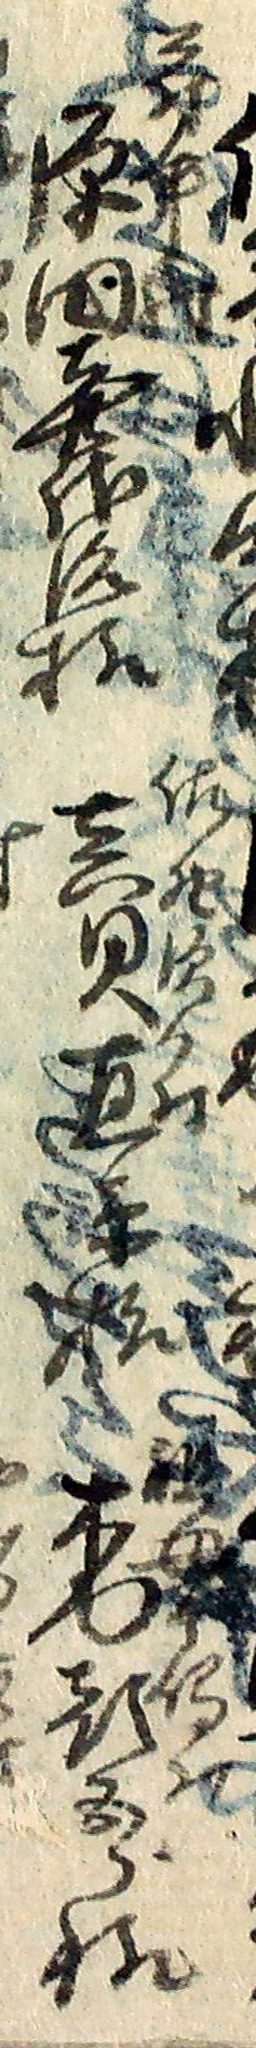原田喜代治様真貝直衛様木内彦五郎様
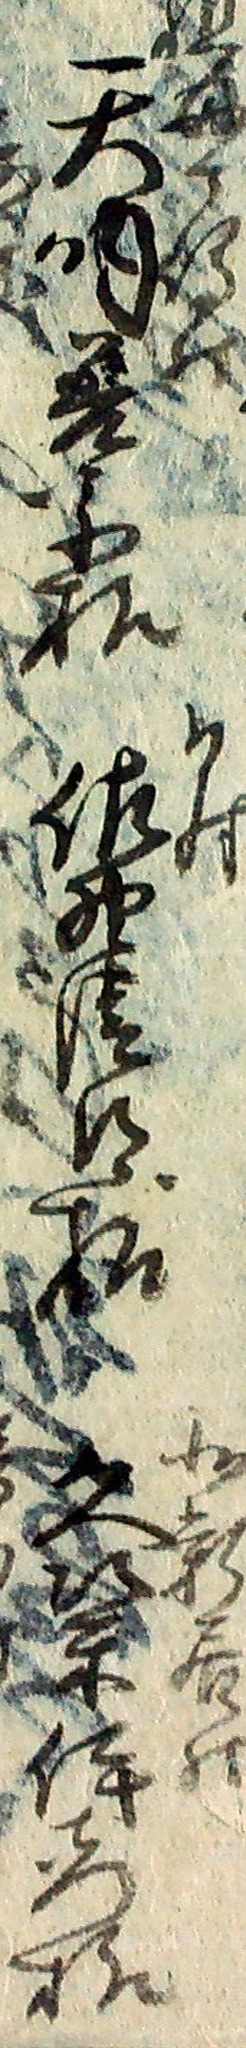天羽善兵衛様佐野清次郎様久須米伊右衛門様
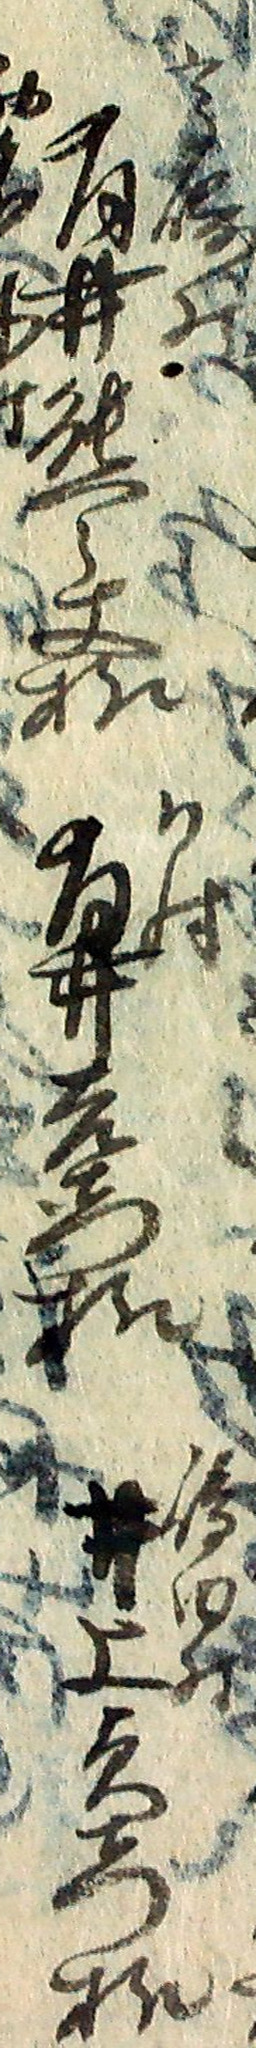有井熊之丈様有井吉右衛門様井上貞右衛門様
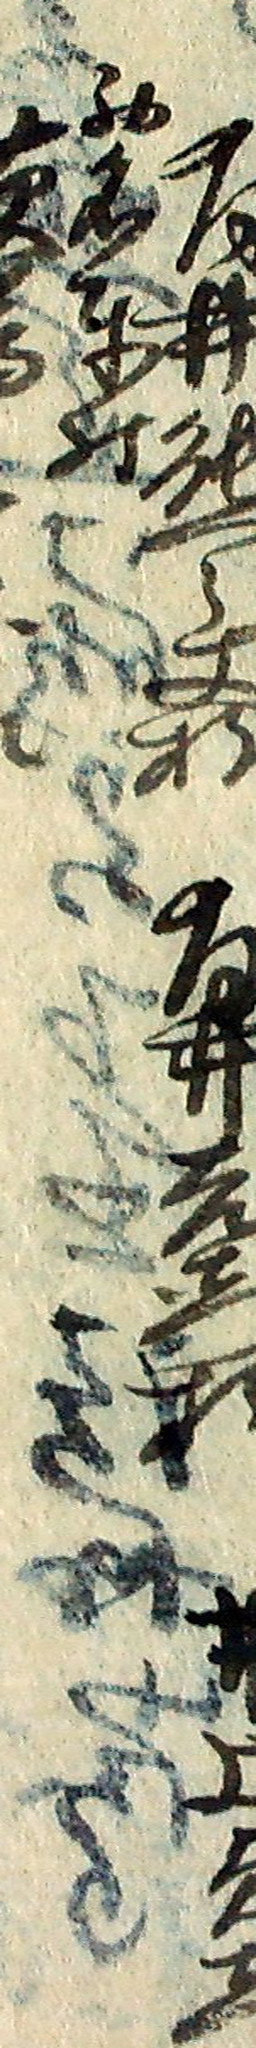西名東村
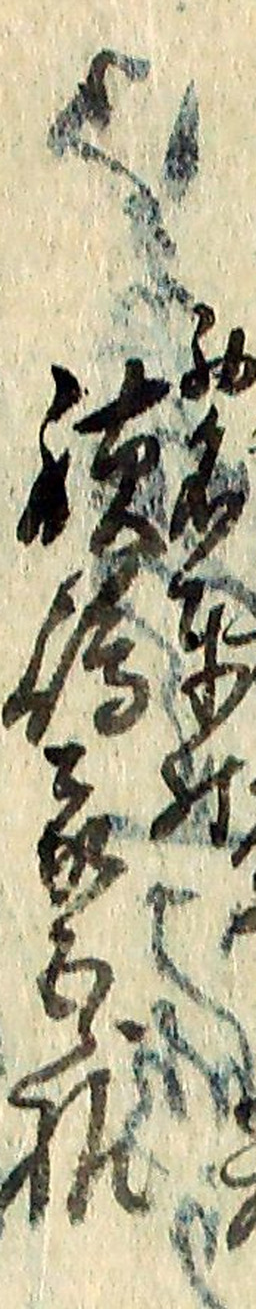禎島嘉五郎様
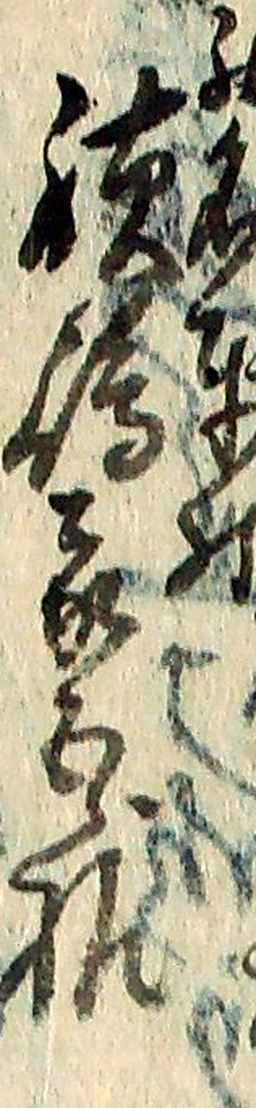禎島嘉五郎様
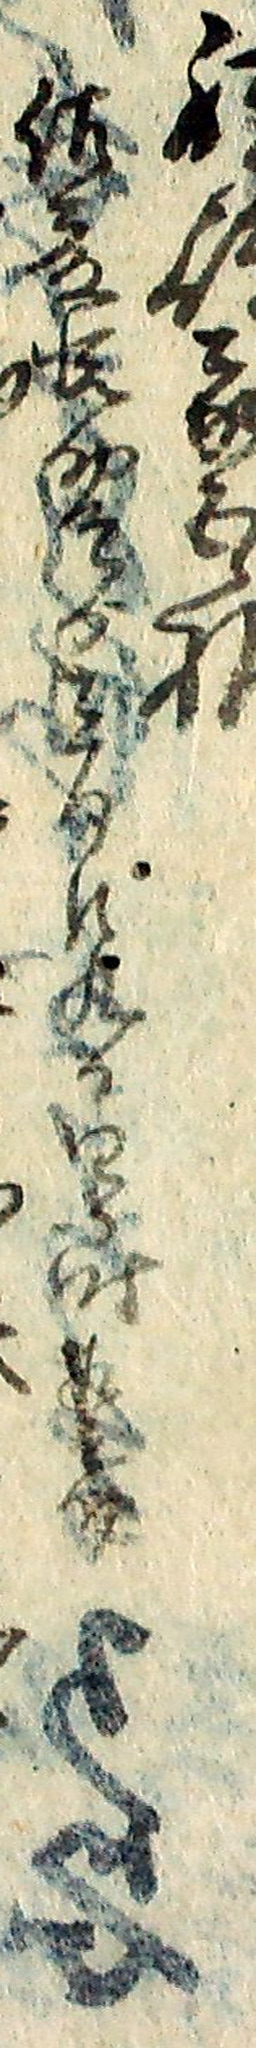佐藤悦助殿ゟ去月廿九日四つ時
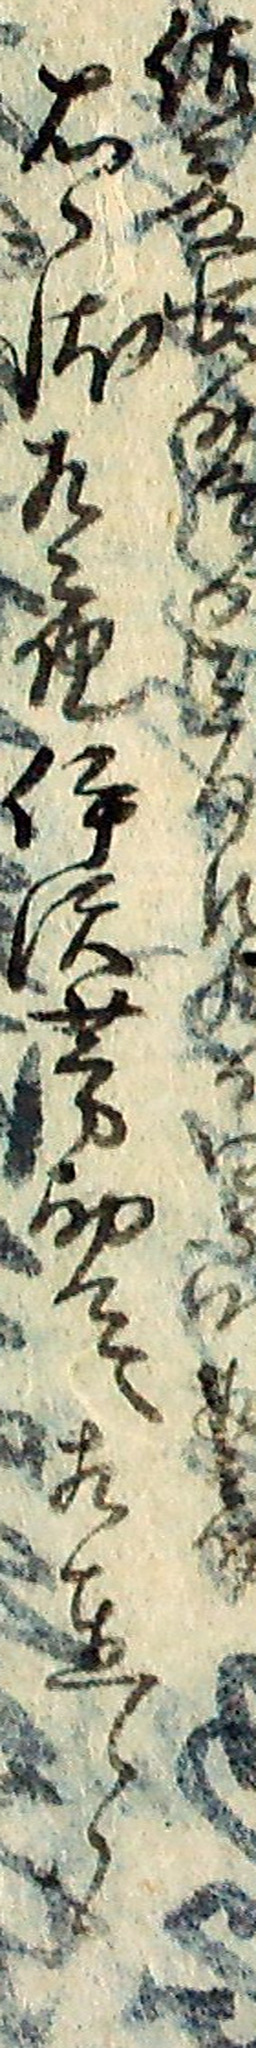右之状相届伊沢芳助殿へ相達候以上
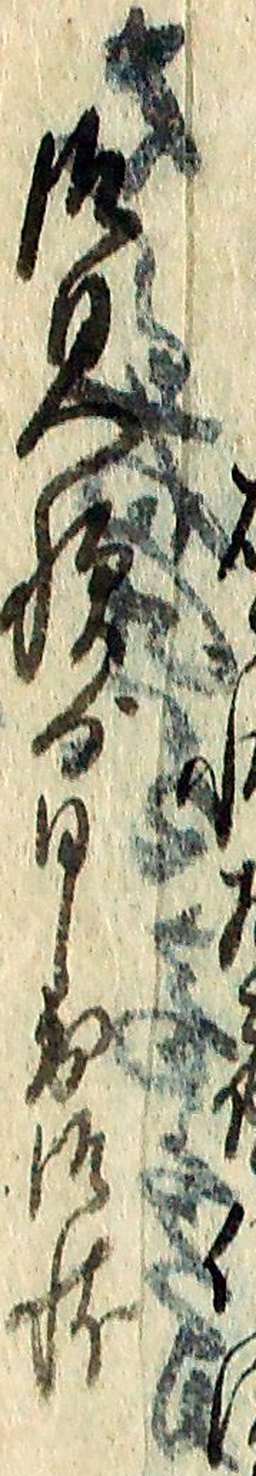御見積ゟ申出御状
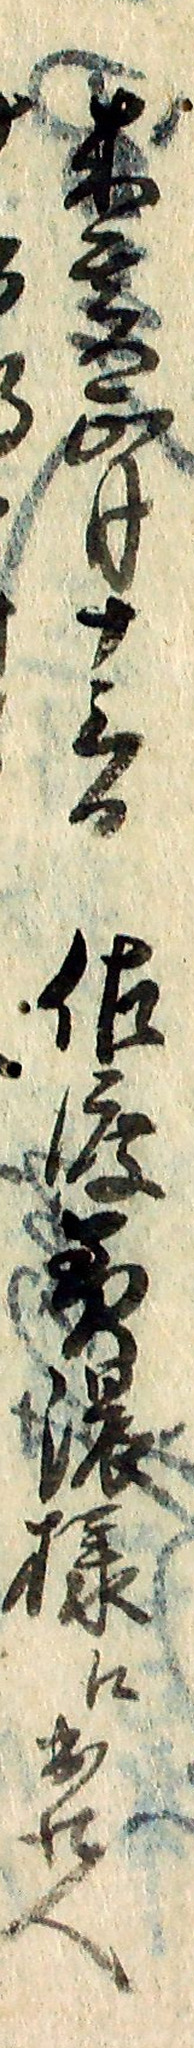来亥正月十三日佐渡美濃様え出仕人
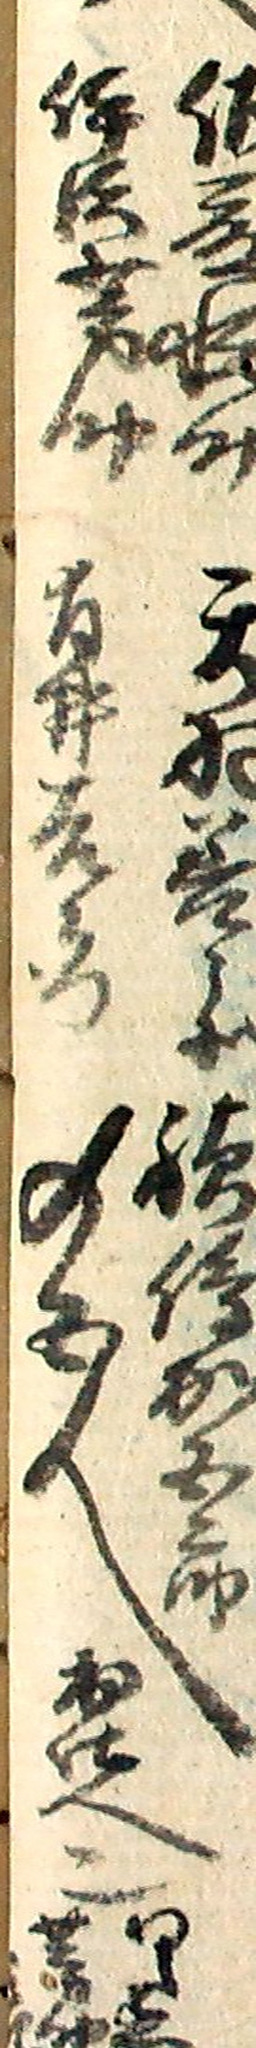伊沢芳助有井吉右衛門〆五人出仕人也芳助

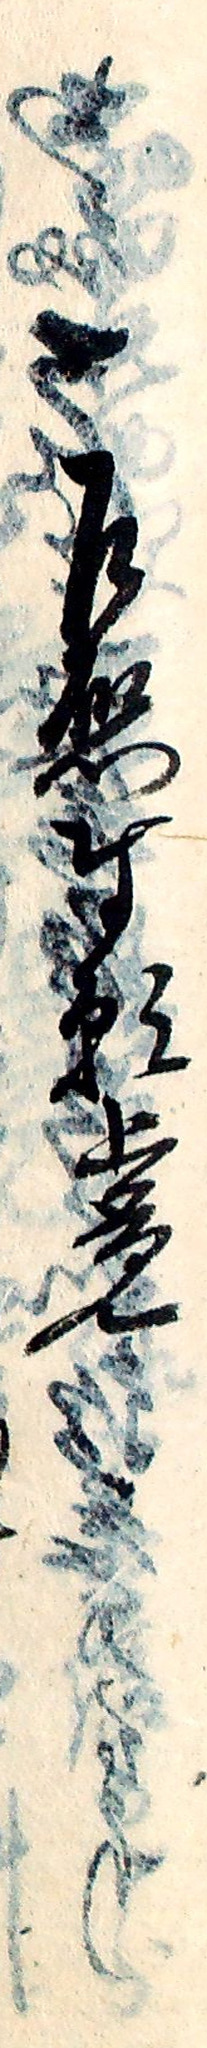乍恐奉願上覚
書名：諸御願書控(後藤氏壱番）
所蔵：鳴門教育大学 Naruto University of Education
